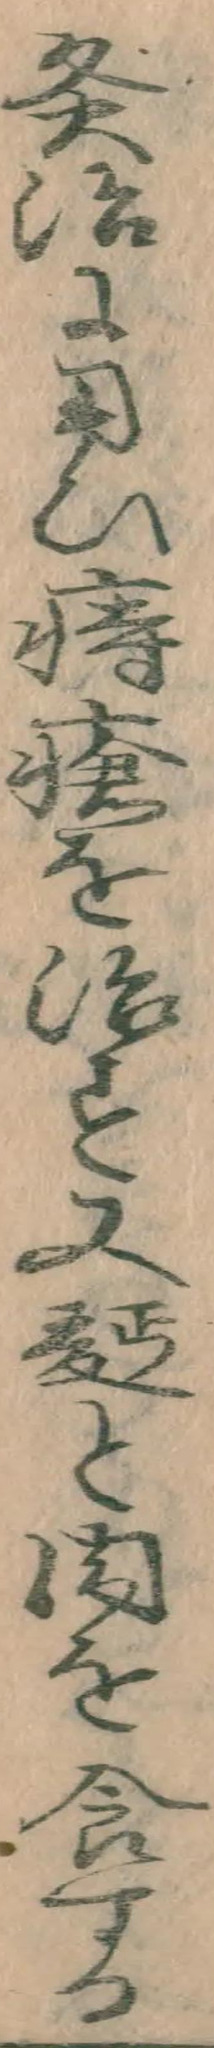灸治に用ひ痔瘡を治す又麪と肉を食する
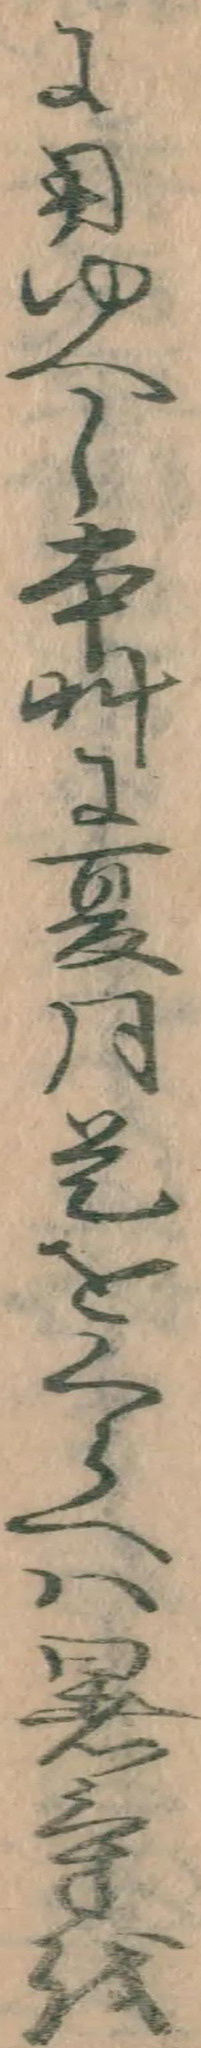に用ゆへし本艸に夏月是をくらへは暑気を
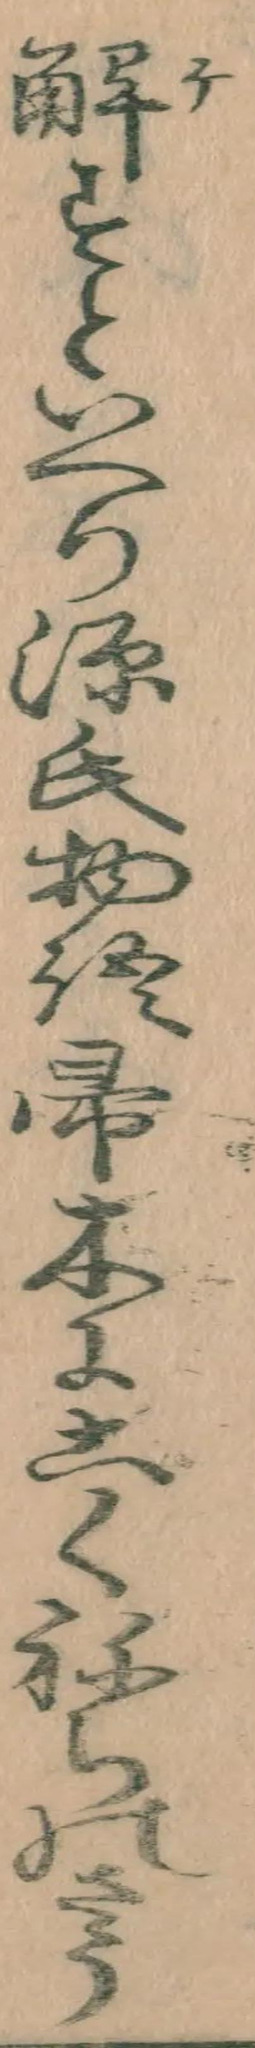解すといへり源氏物語帚木にこくねらのさう
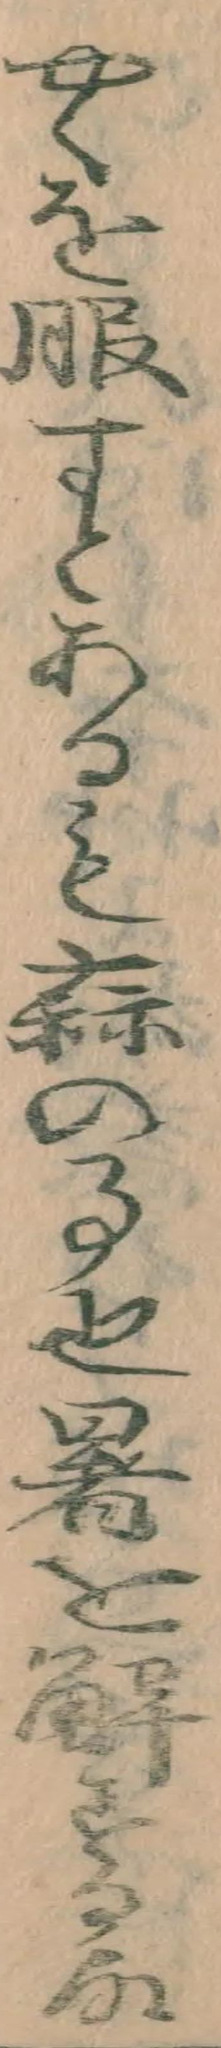やくを服すとあるも蒜の事也暑を解する故
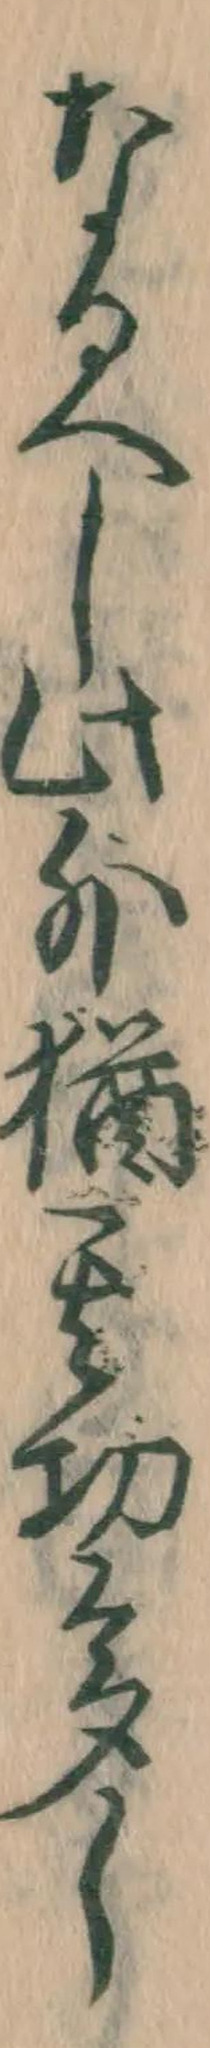なるへし此外猶其功多し
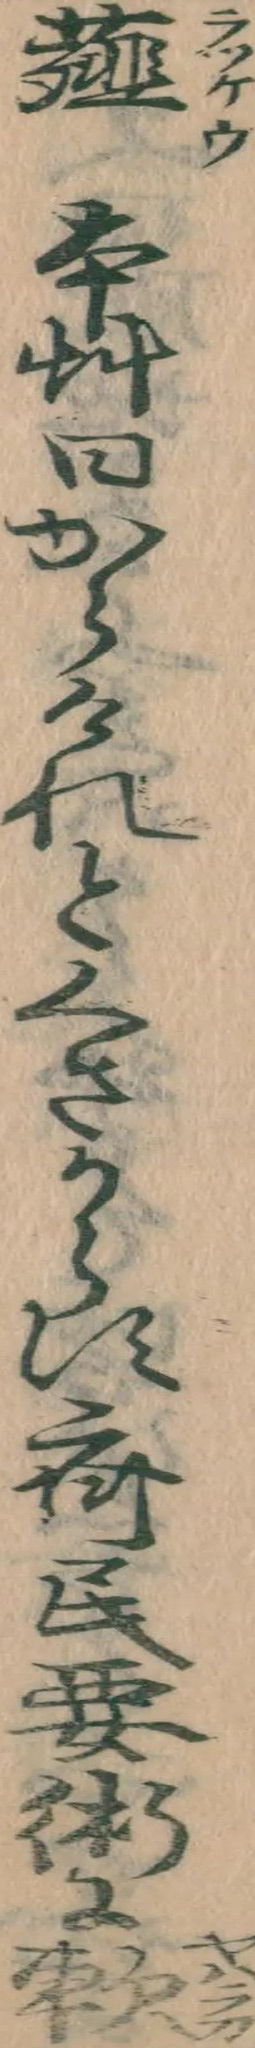薤本艸日からけれとくさからす斉民要術に軟
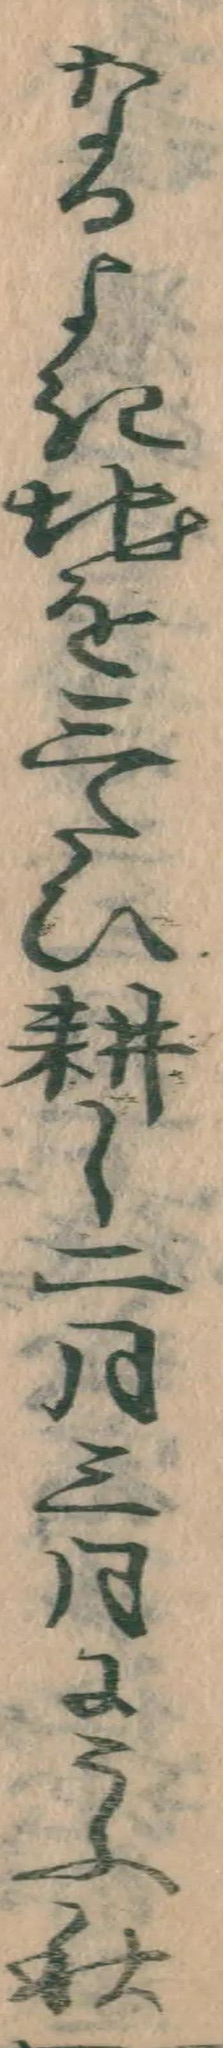なるよき地を三さひ耕し二月三月にうふ秋
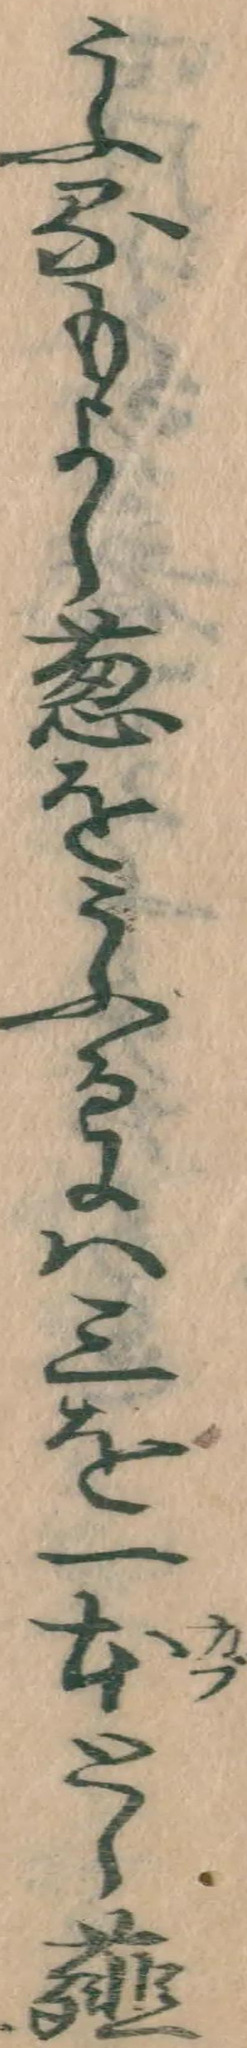うふるもよし葱をうふるには三を一本として薤
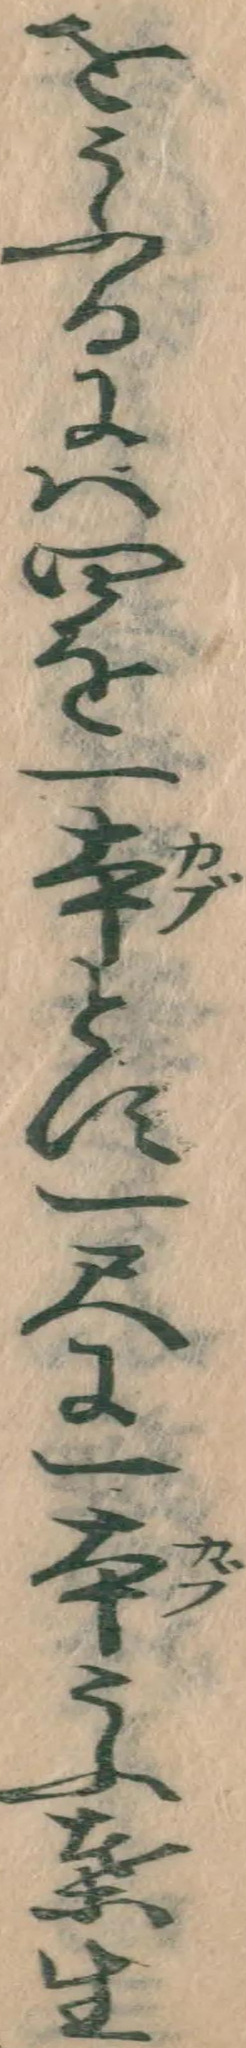をうふるには四を一本とす一尺に一本うふ葉生
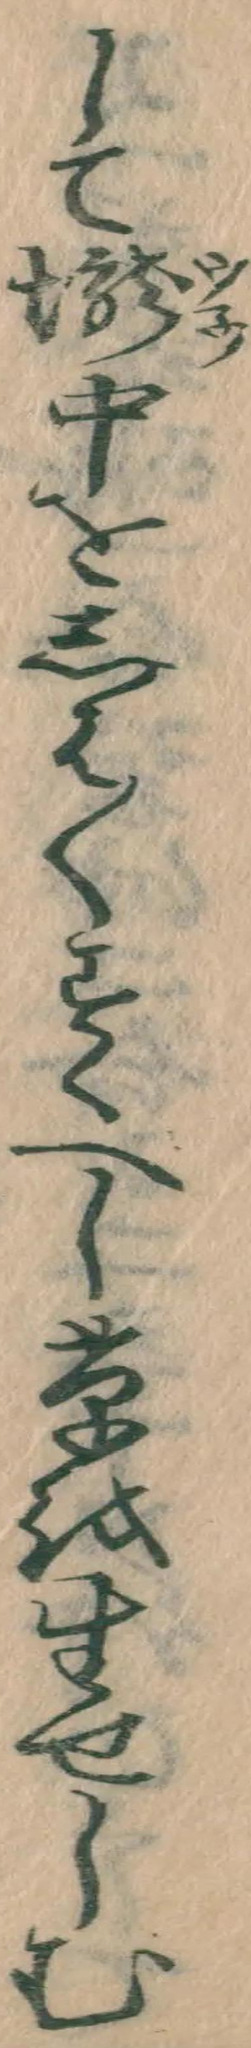して攏中をしは〳〵すくへし草を生せしむ
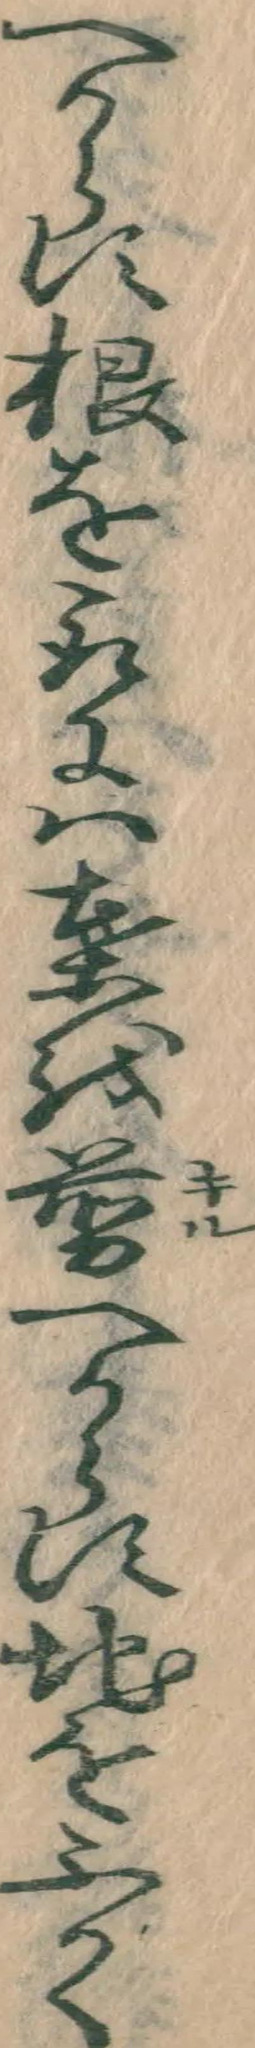へからす根を取には葉を剪へからす地をふかく
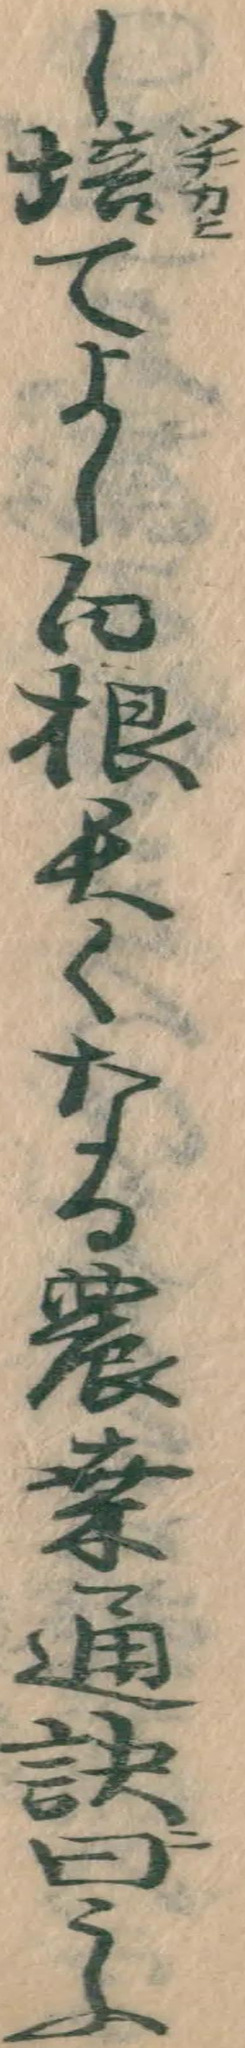し培てよし白根長くなる農桑通訣に曰うふ
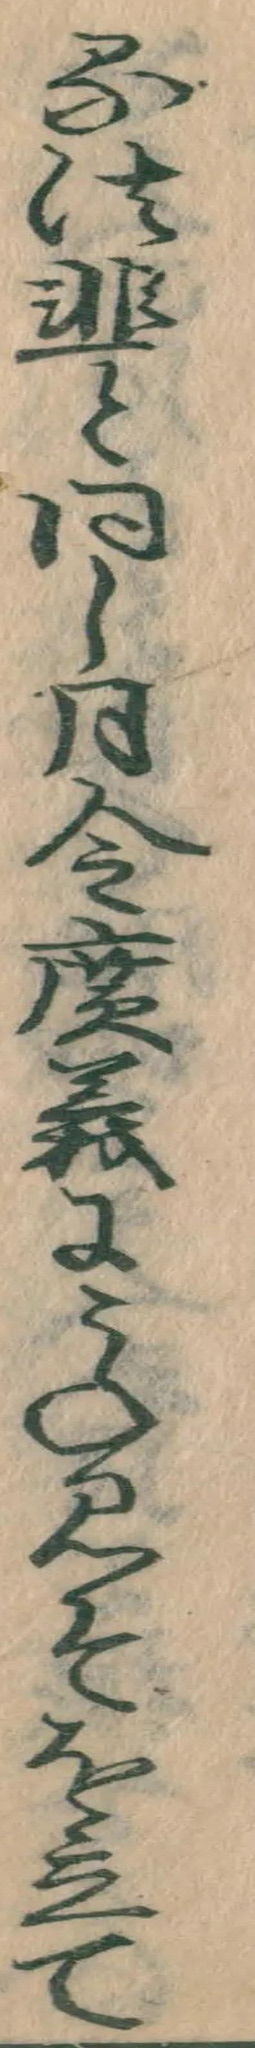る法韭と同し月令広義にうねみそを立て
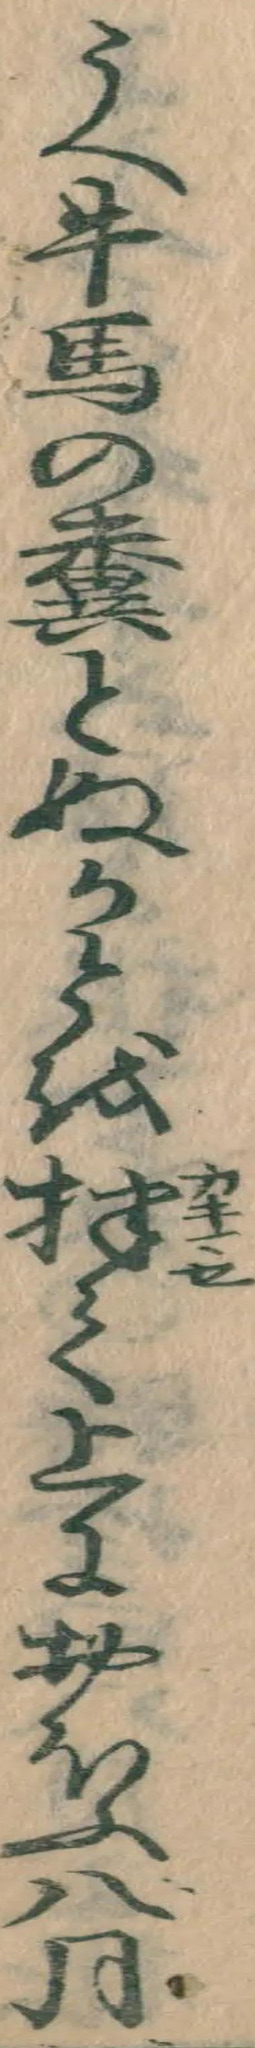うへ牛馬の糞とぬかとを拌て上におほふ八月

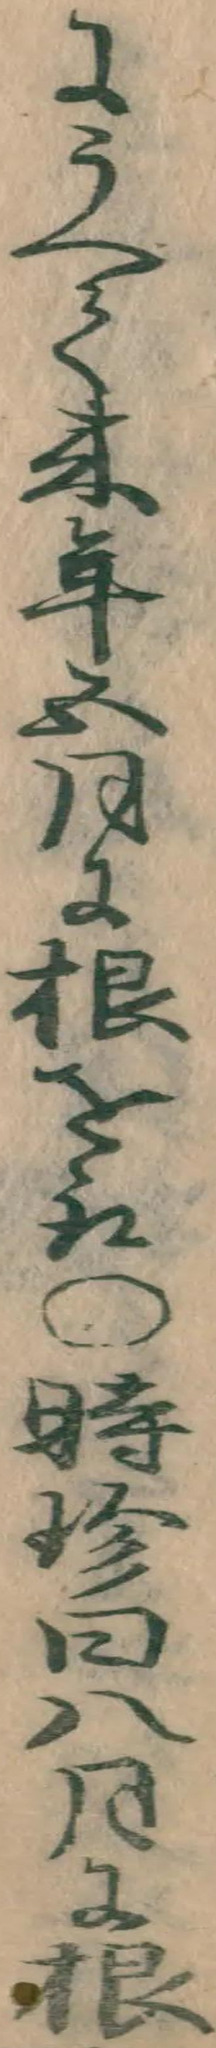にうへて来年五月に根を取〇時珍曰八月に根
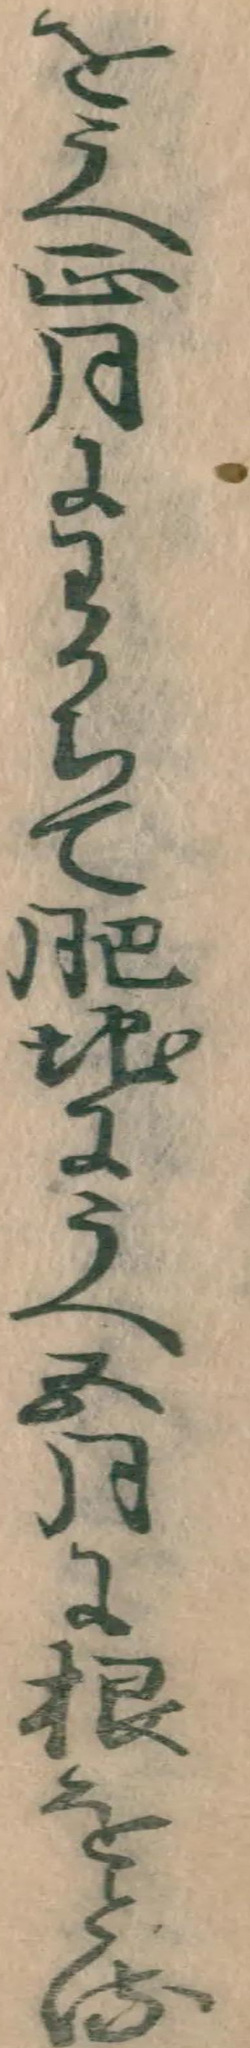をうへて正月にわかちて肥地にうへ五月に根をとる
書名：菜譜 3巻
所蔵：国立国会図書館 National Diet Library, JAPAN
